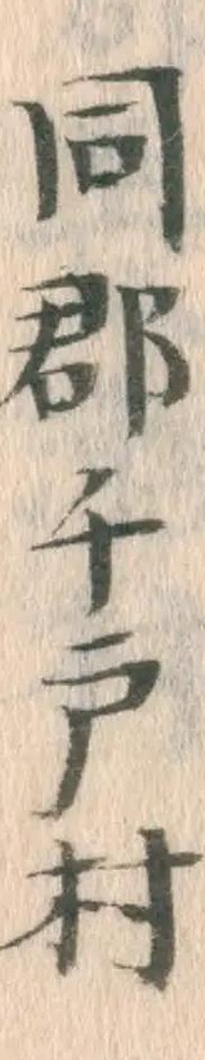同郡千戸村
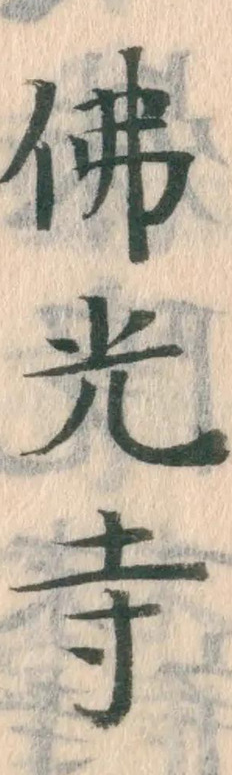大光寺
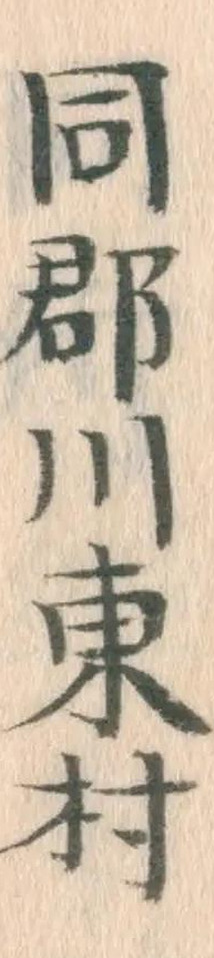同郡川東村
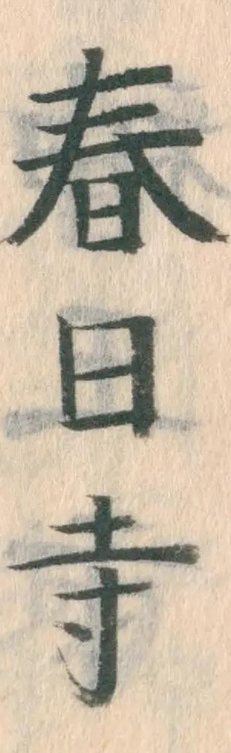春日寺

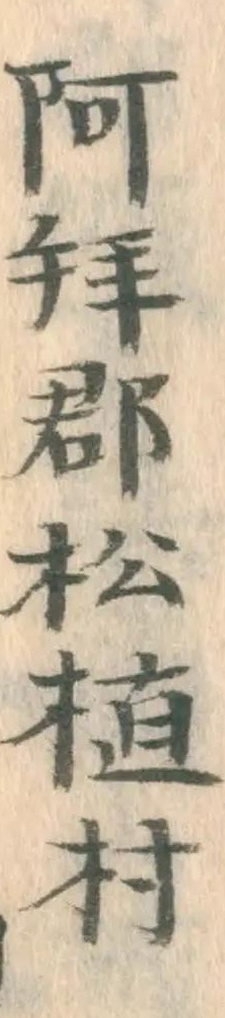阿拝郡松植村
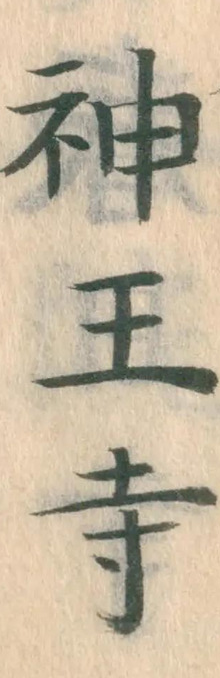神王寺
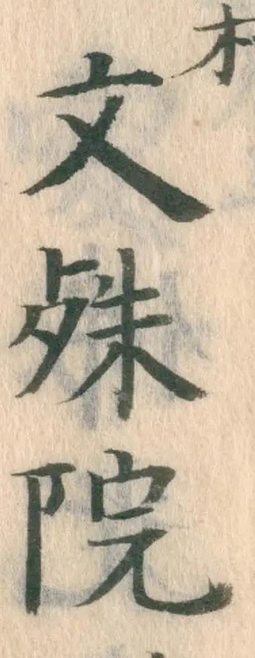文殊院
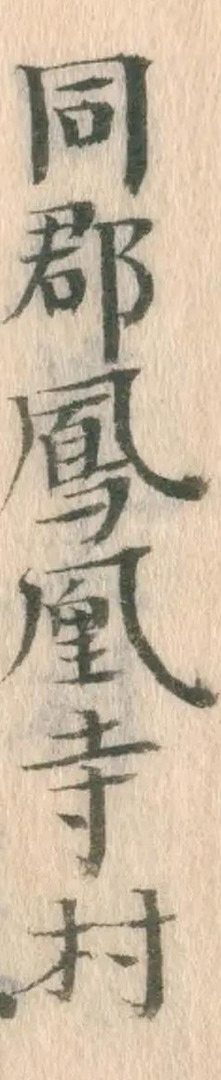同郡鳳凰時寺村
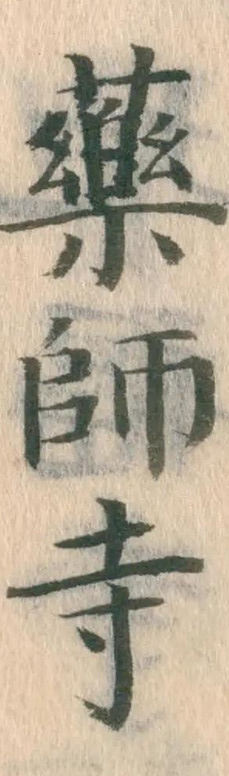薬師寺
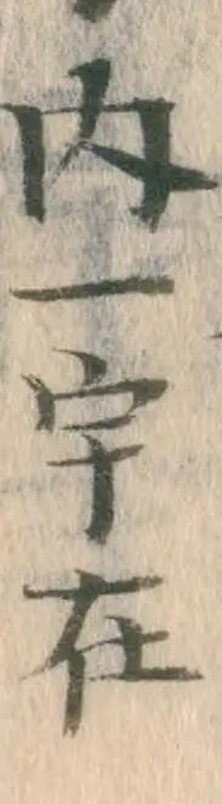内一宇在
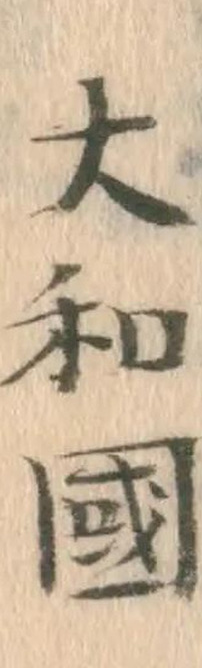大和国
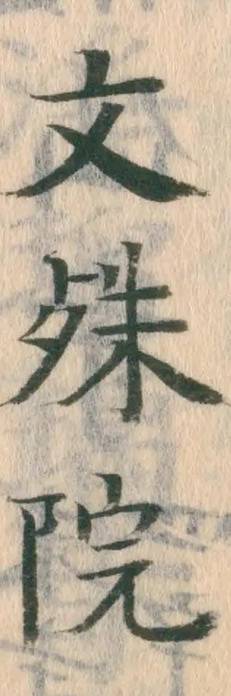文殊院
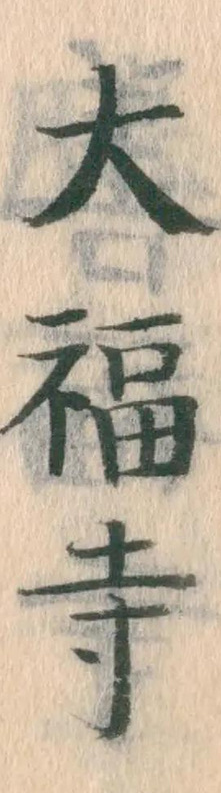大福寺

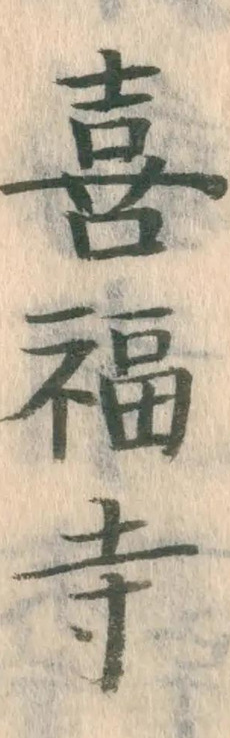喜福寺
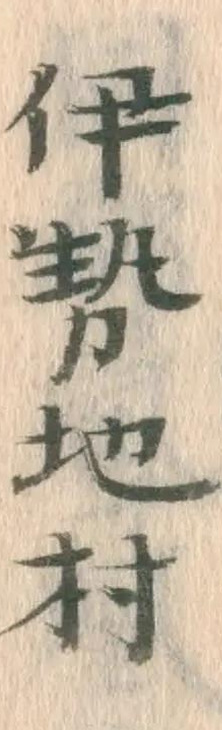伊勢地町
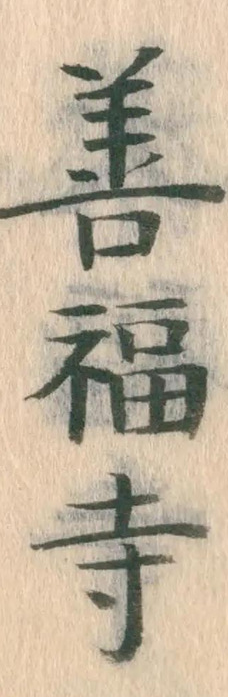善福寺
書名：古義真言宗本末帳 21巻. [4] 第三 伊賀国、伊勢国、志摩国、尾張国、三河国、遠江国、駿河国、伊豆国、甲斐国
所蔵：国立国会図書館 National Diet Library, JAPAN
